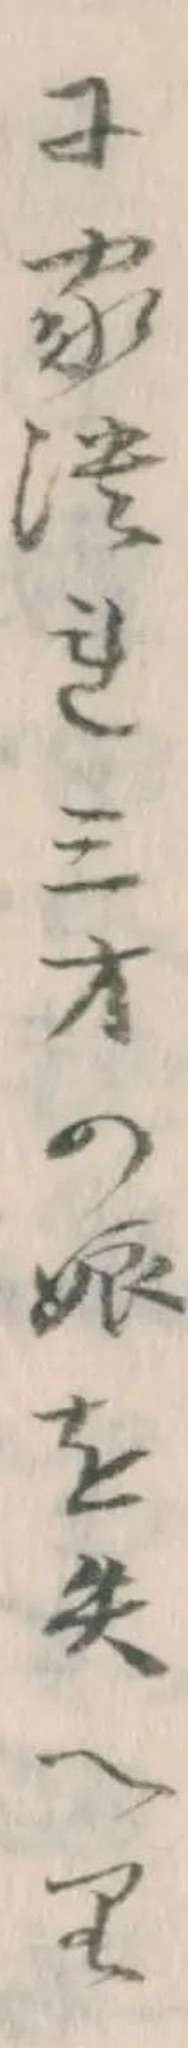に家潰れ三才の娘を失へり
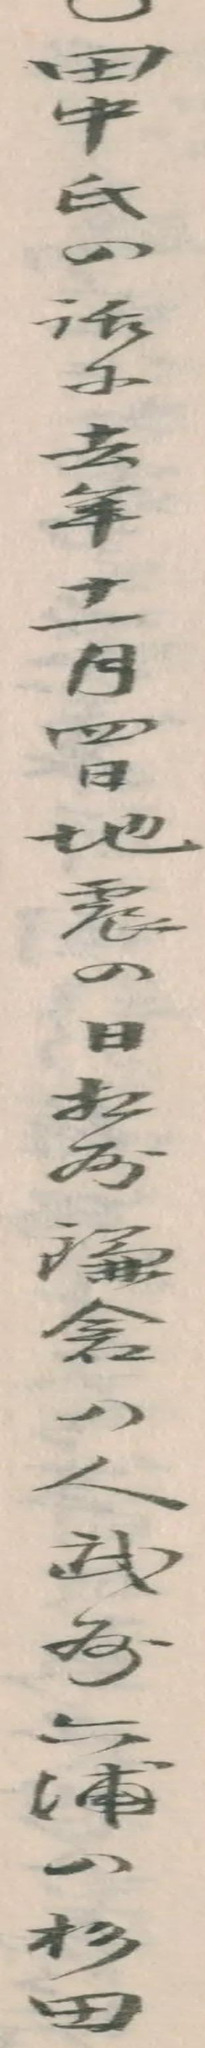〇田中氏の話に去年十一月四日地震の日相州鎌倉の人武州六浦の杉田
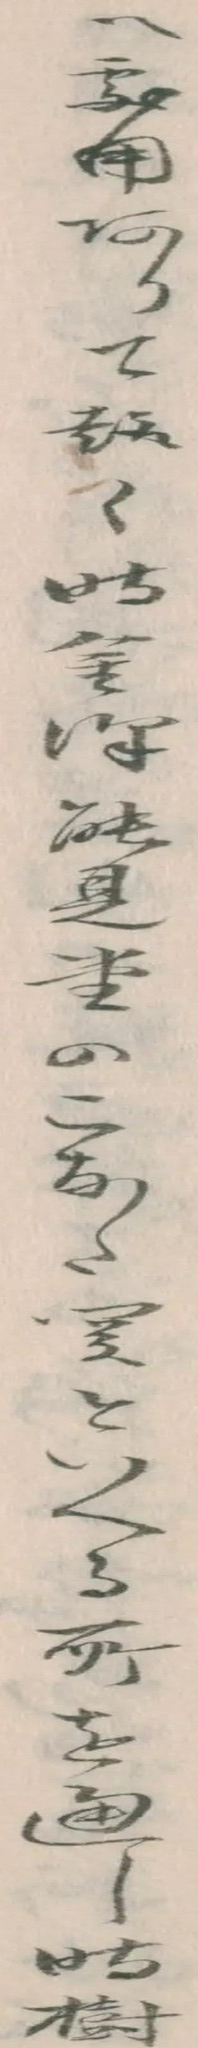へ處用ありて趣く時金沢能見堂のこなた関といへる所を通し時樹
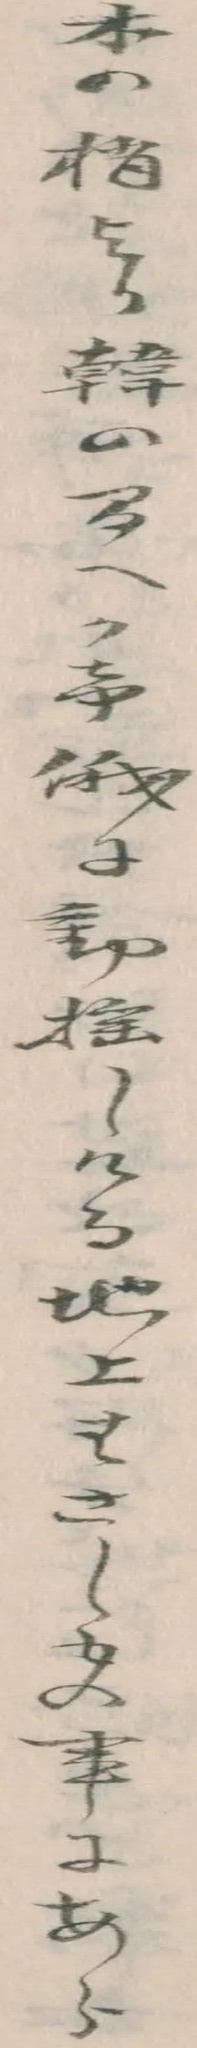木の梢より韓の間へかけ俄に動揺しける地上はさしもの事にあら
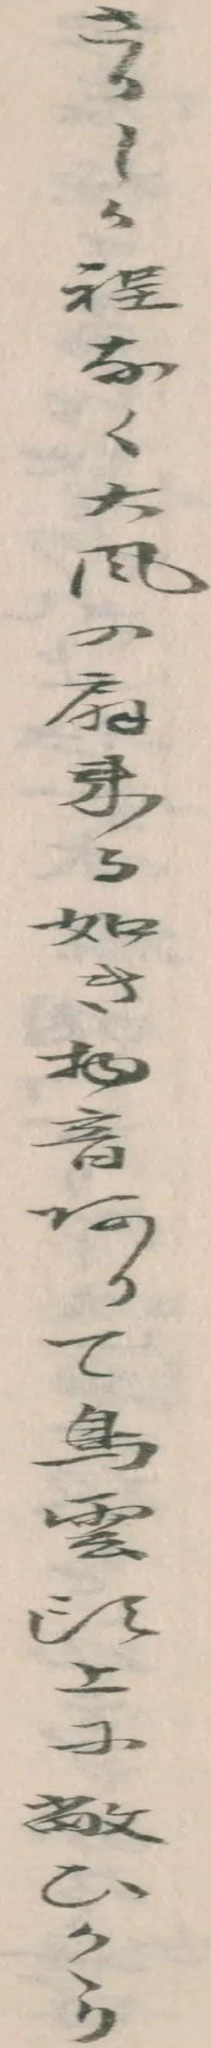さりしか程なく大風の扇来る如き物音ありて鳥雲頭上に敝ひかゝり
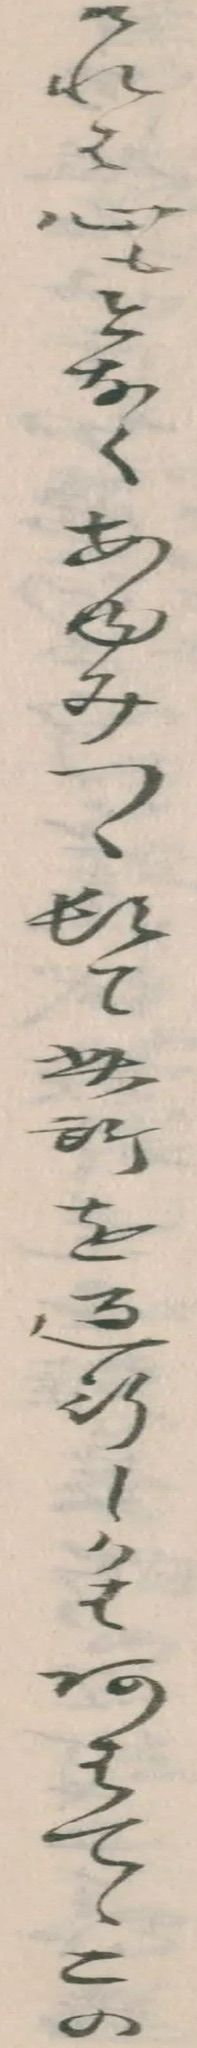けれは心もとなくあゆみつゝ頓て此所を過行しかはあはてゝこの
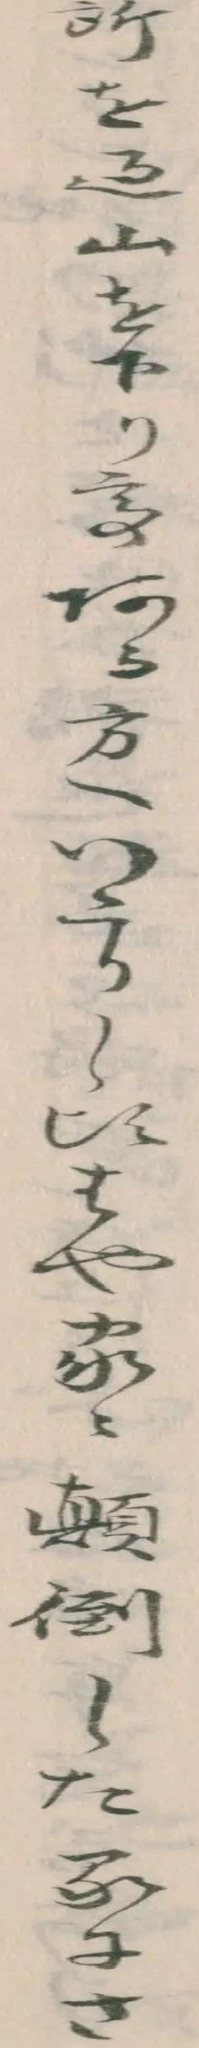所を過山を下りてあるか方へいたりし頃はや家々顛倒したるにさ
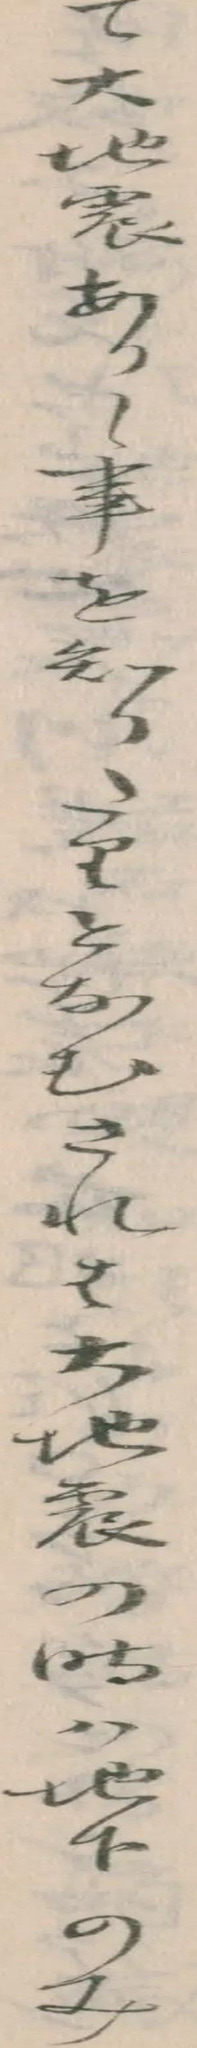て大地震ありし事を知りたりとなむされは大地震の時は地下のみ
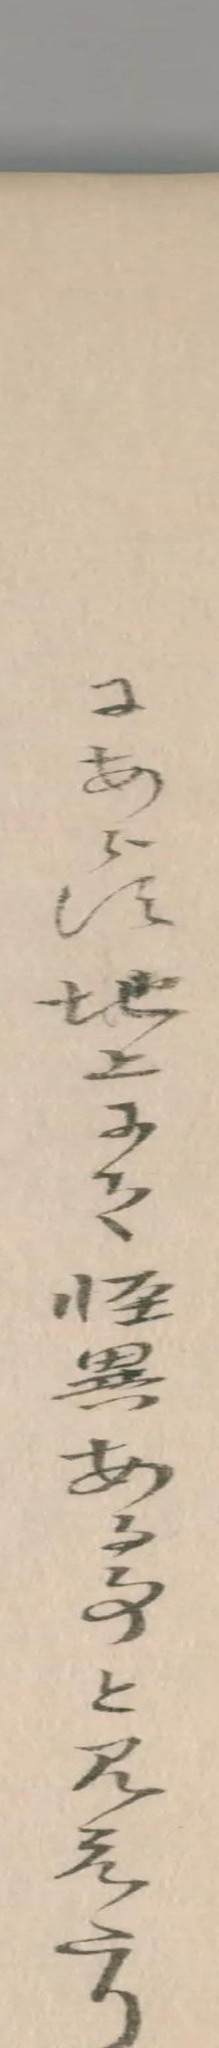にあらす地上にて怪異ある事と見えたり
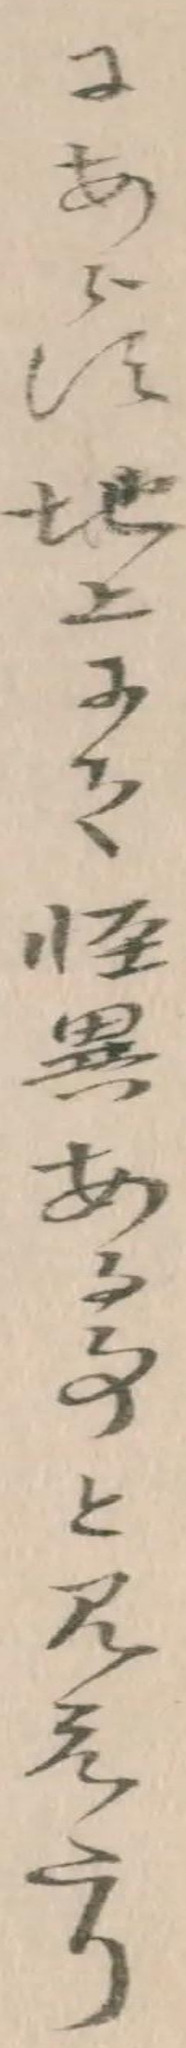にあらす地上にて怪異ある事と見えたり

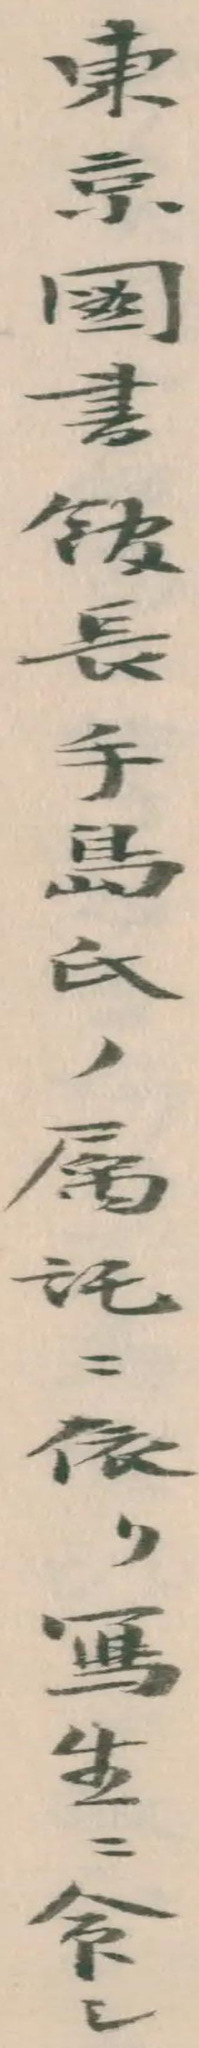東京図書館長手島氏ノ属託ニ依リ写生ニ命シ
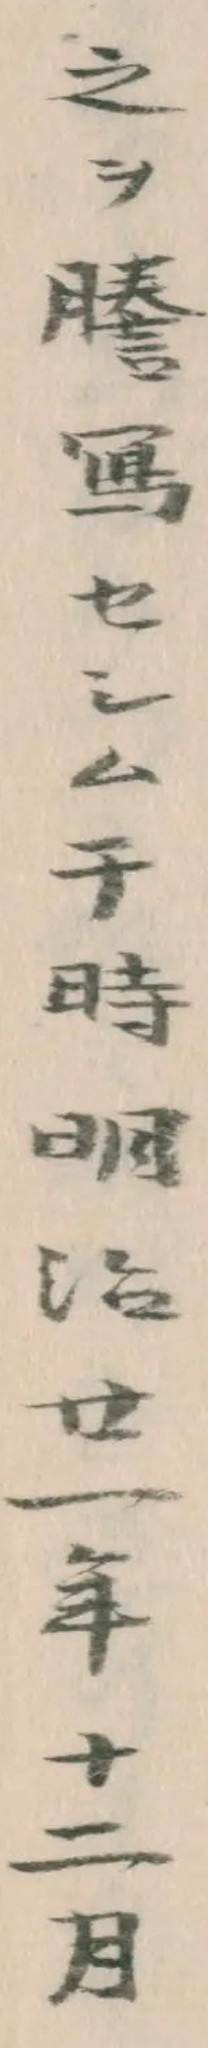之ヲ謄写セシム于時明治廿一年十二月
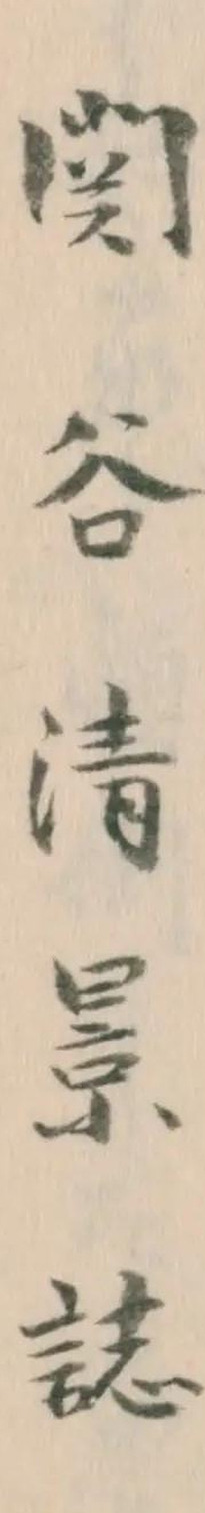関谷清景誌
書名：地災撮要. 巻7-9(地震之部)
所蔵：国立国会図書館 National Diet Library, JAPAN
